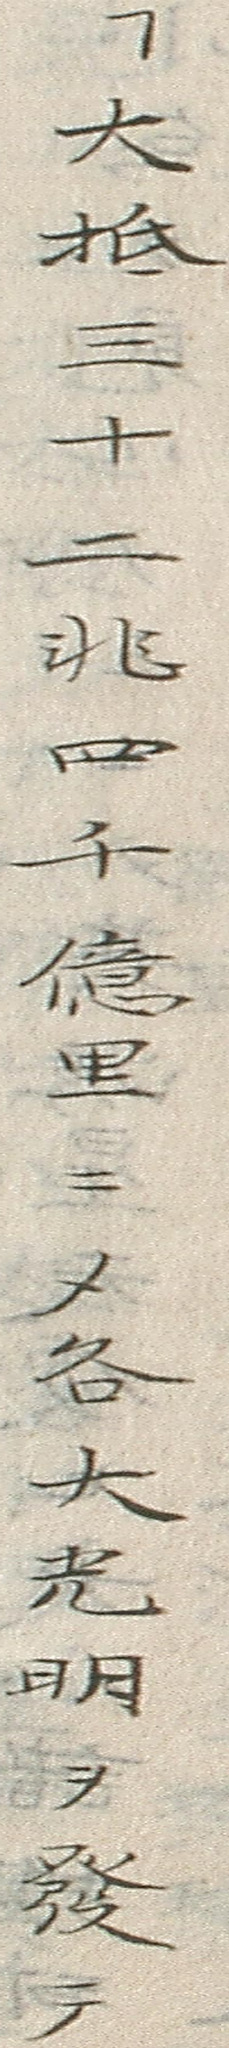コト大抵三十二兆四千億里ニシテ各大光明ヲ発テ
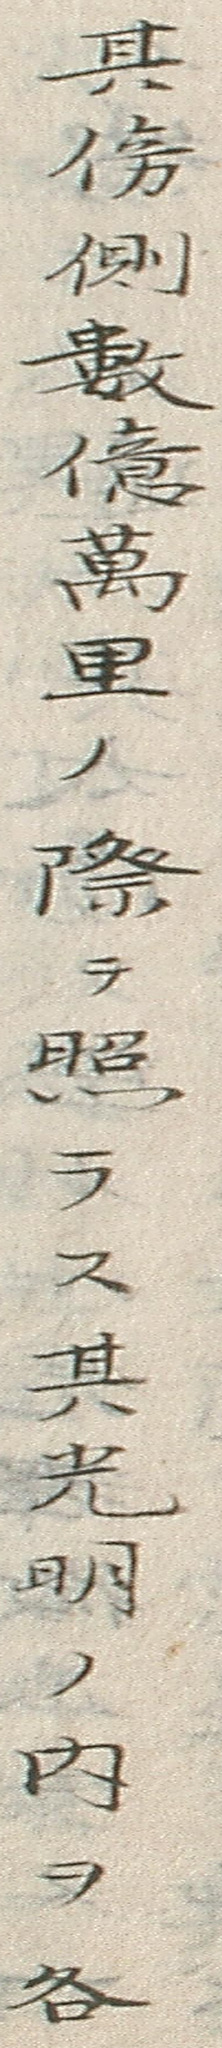其傍側数億万里ノ際ヲ照ラス其光明ノ内ヲ各
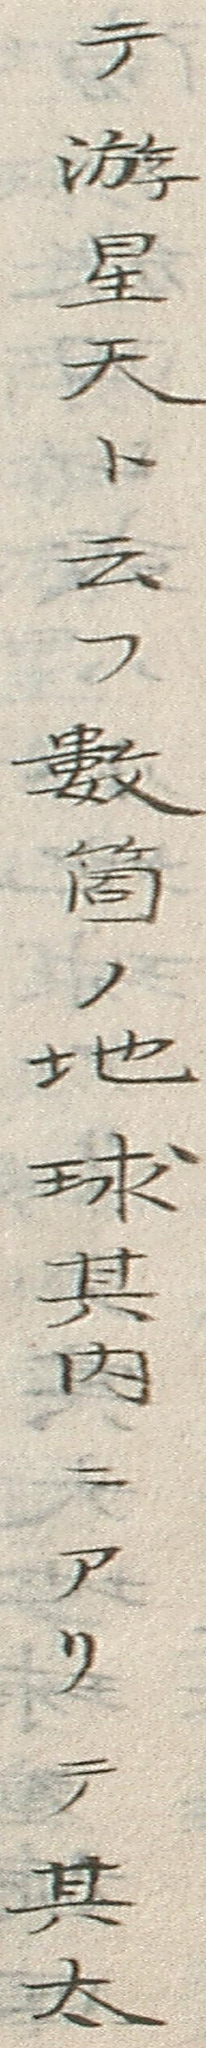テ游星天ト云フ数箇ノ地球其内ニアリテ其太

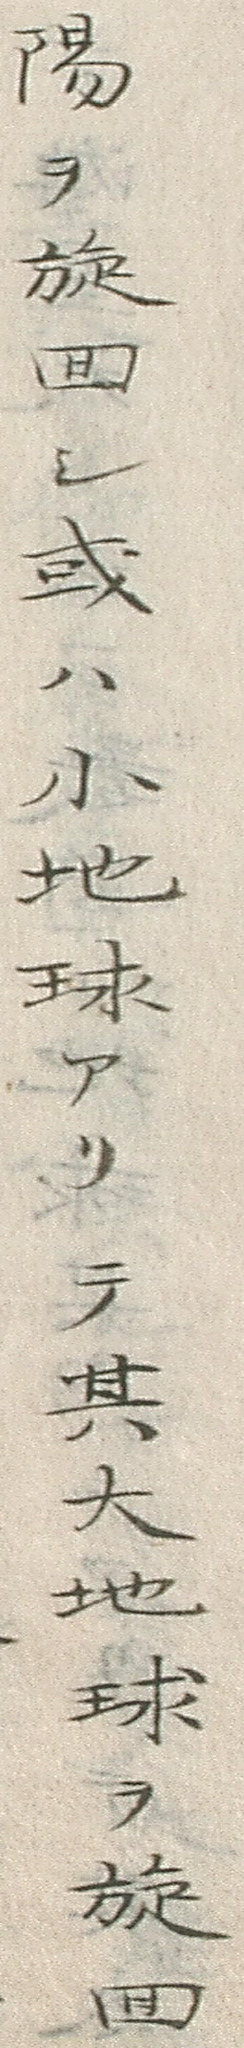陽ヲ旋回シ或ハ小地球アリテ其大地球ヲ旋回
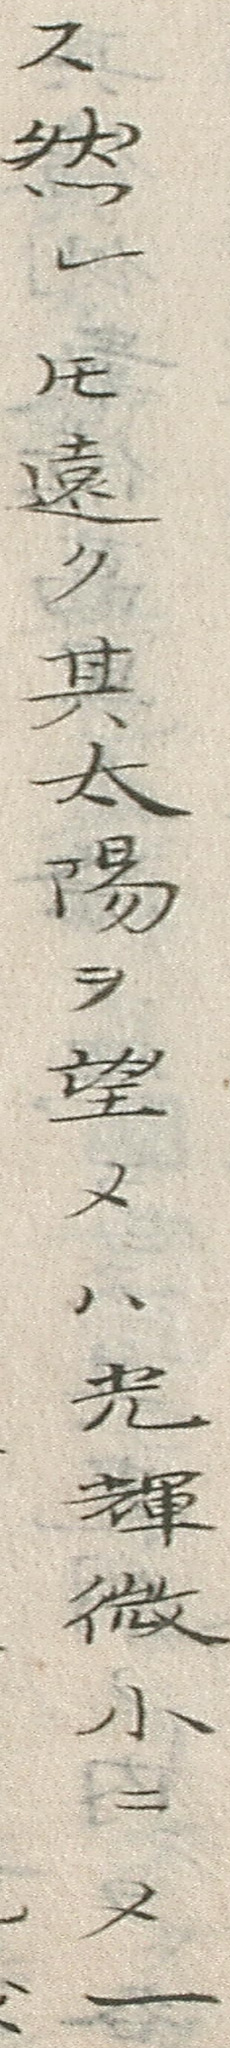ス然レトモ遠ク其太陽ヲ望メハ光輝微小ニシテ一
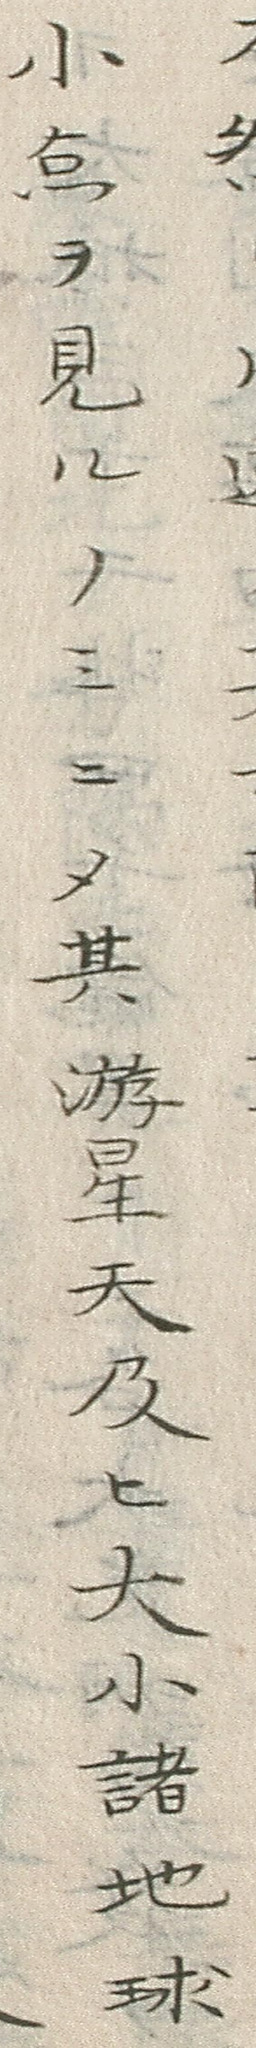小点ヲ見ルノミニシテ其游星天及ヒ大小諸地球
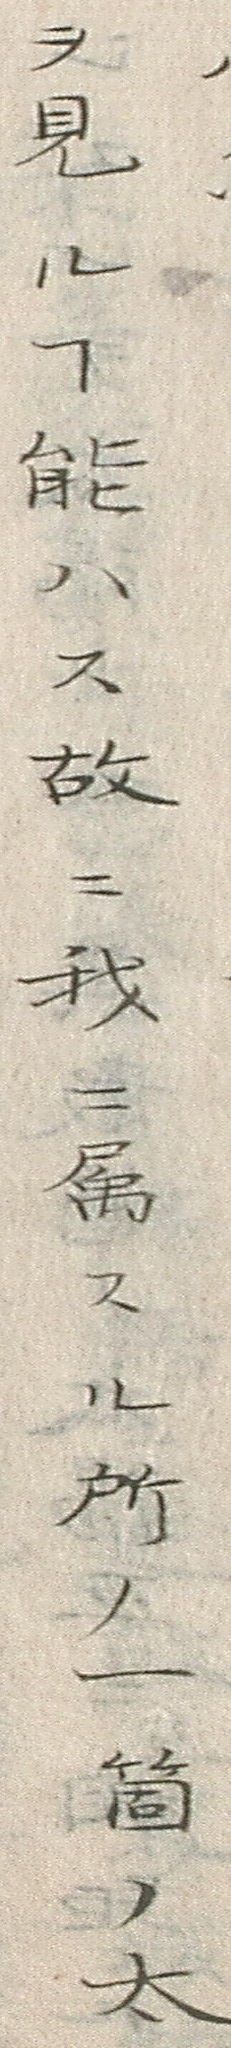ヲ見ルコト能ハス故ニ我ニ属スル所ノ一箇ノ太
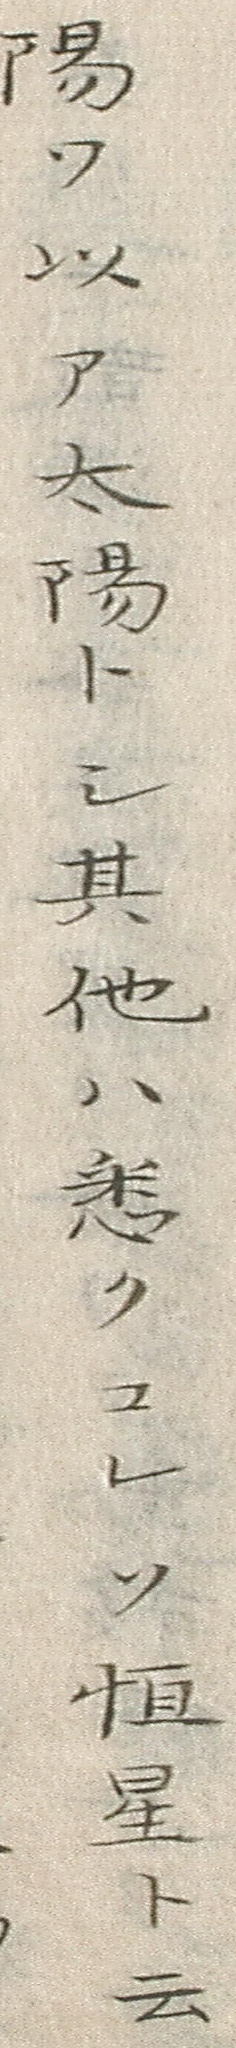陽ワ以ア太陽トシ其他ハ悉クコレソ恒星ト云
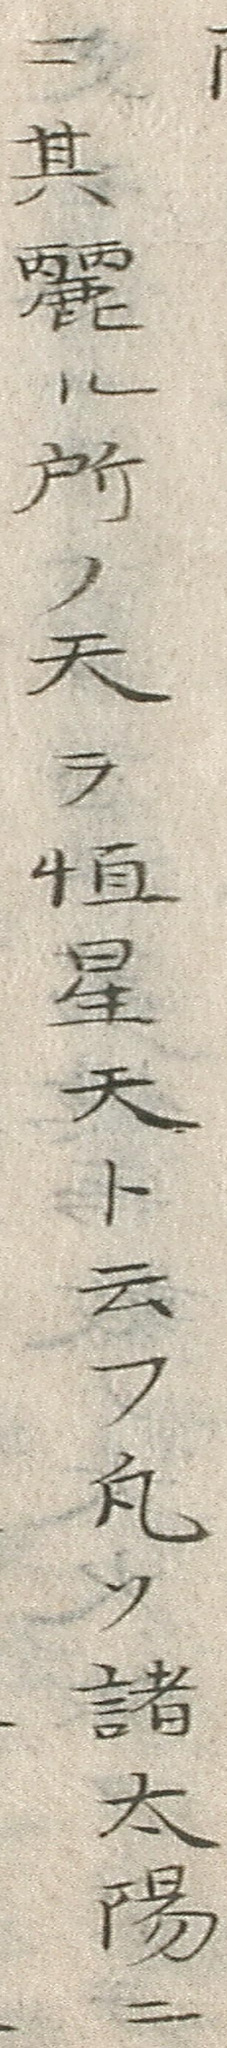ニ其麗ル所ノ天ヲ恒星天ト云フ凡ソ諸太陽ニ
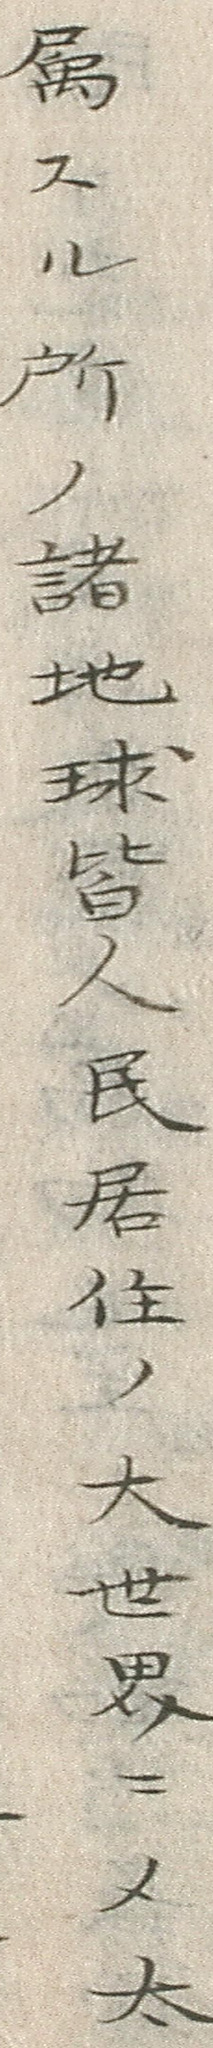属スル所ノ諸地球皆人民居住ノ大世界ニシテ太
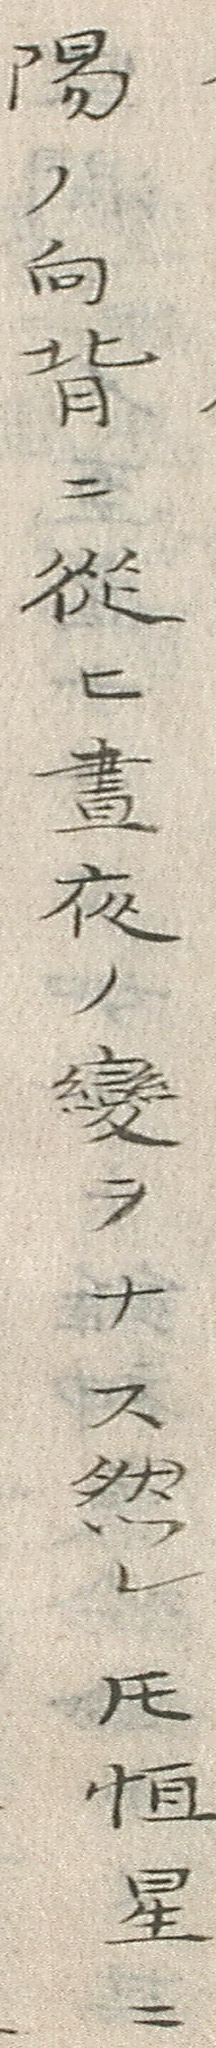陽ノ向背ニ従ヒ昼夜ノ変ヲナス然レトモ恒星ニ
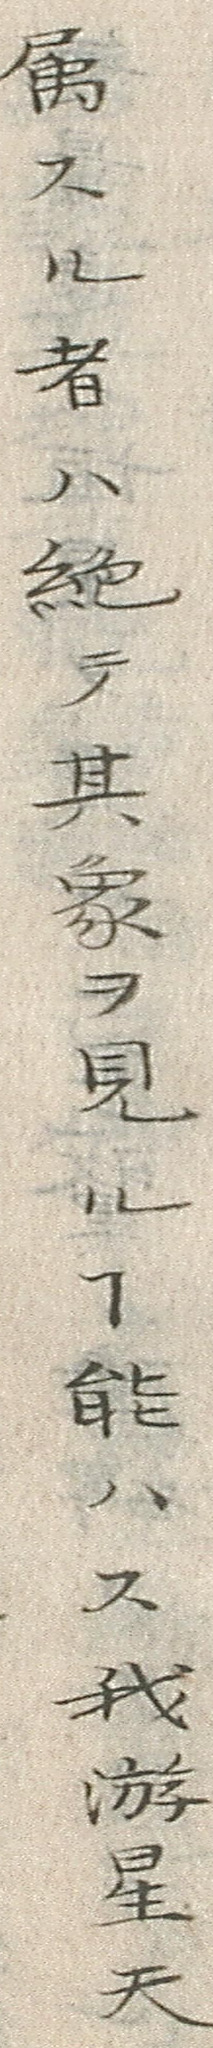属スル者ハ絶テ其象ヲ見ルコト能ハス我游星天
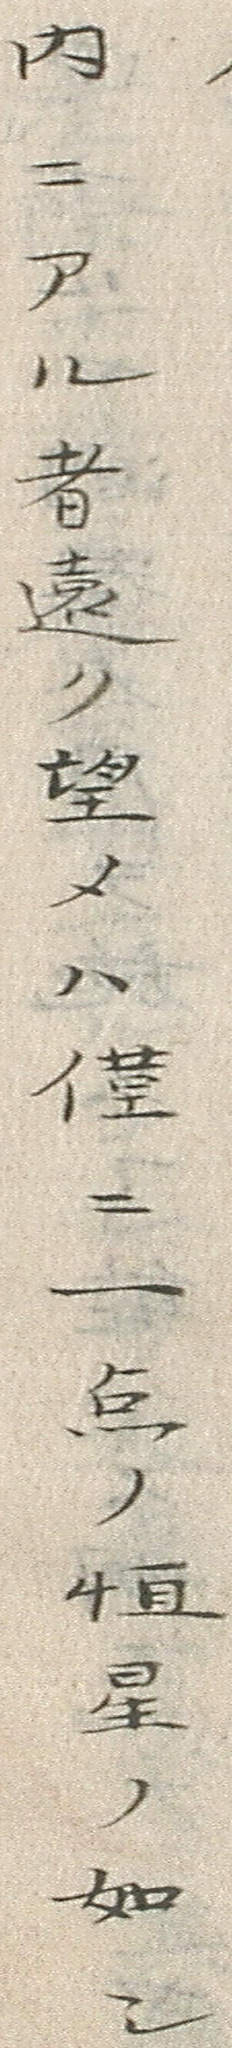内ニアル者遠ク望メハ僅ニ一点ノ恒星ノ如シ
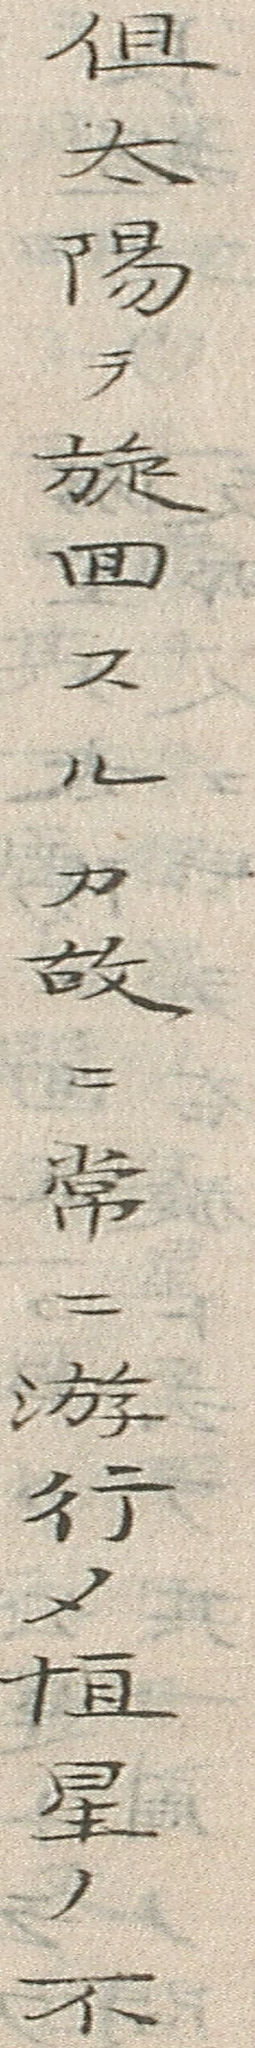但太陽ヲ旋回スルカ故ニ常ニ游行シテ恒星ノ不
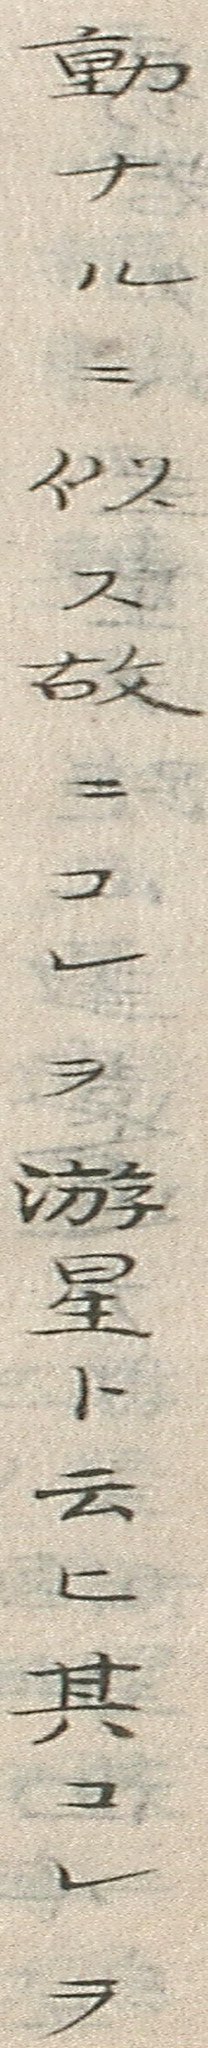動ナルニ似ス故ニコレヲ游星ト云ヒ其コレヲ
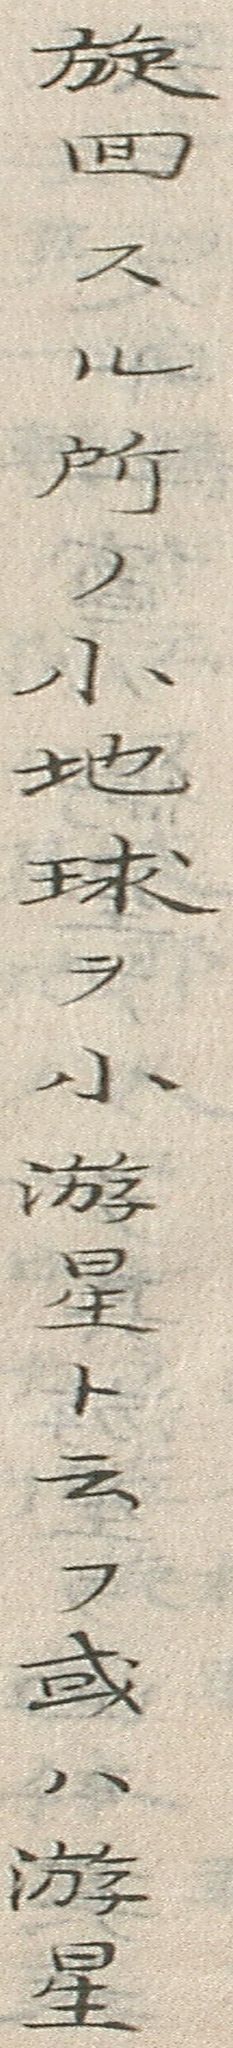旋回スル所ノ小地球ヲ小游星ト云フ或ハ游星
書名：天學略名目羽翼　全
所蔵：東京大学地震研究所図書室 Earthquake Research Institute Library, The University of Tokyo, JAPAN
